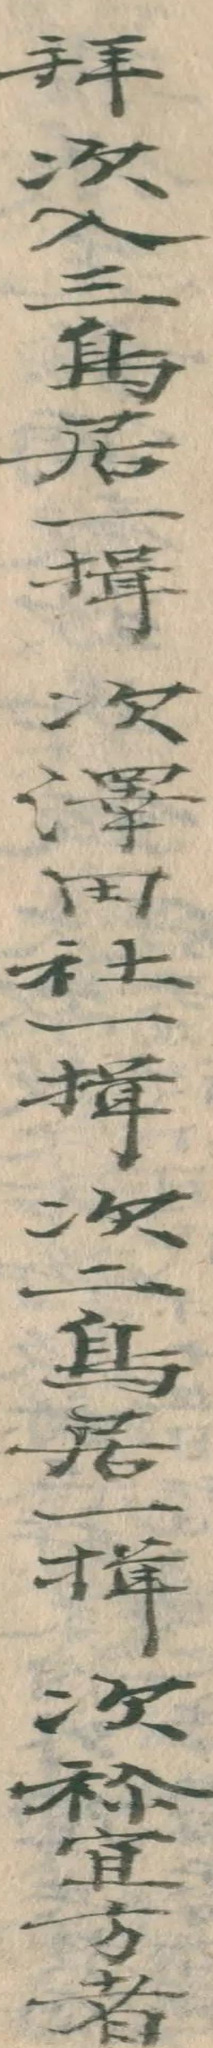拜次入三鳥居一揖次澤田社一揖次二鳥居一揖次祢宜方者
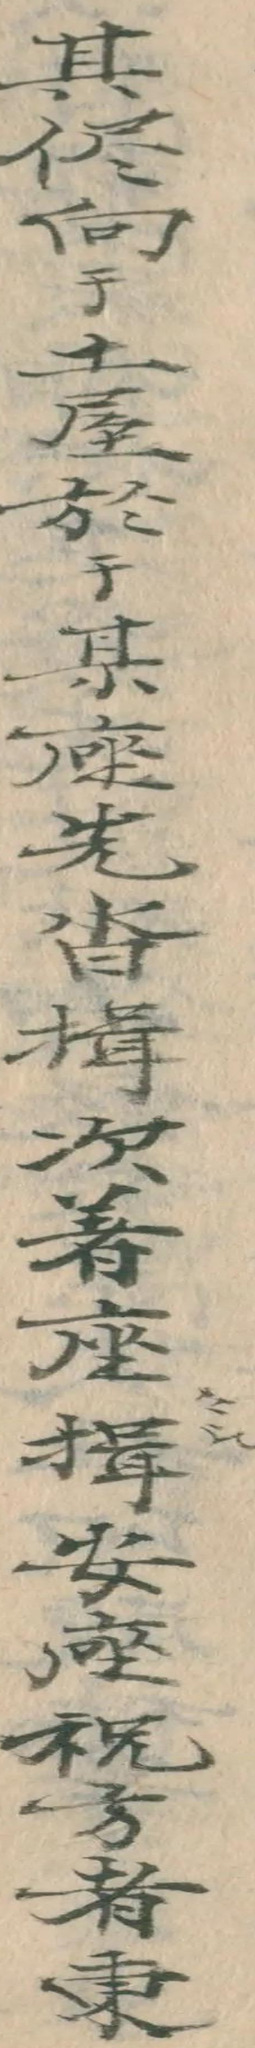其侭向于土屋於于某座先沓揖次着座揖安座祝方者東
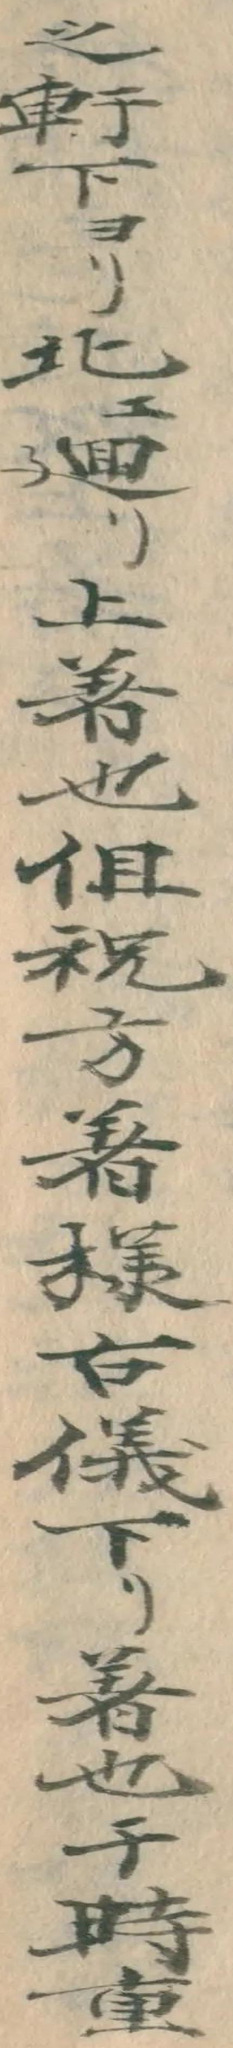之軒下ヨリ北エ廻リ上着也但祝方着様右儀下リ着也于時重

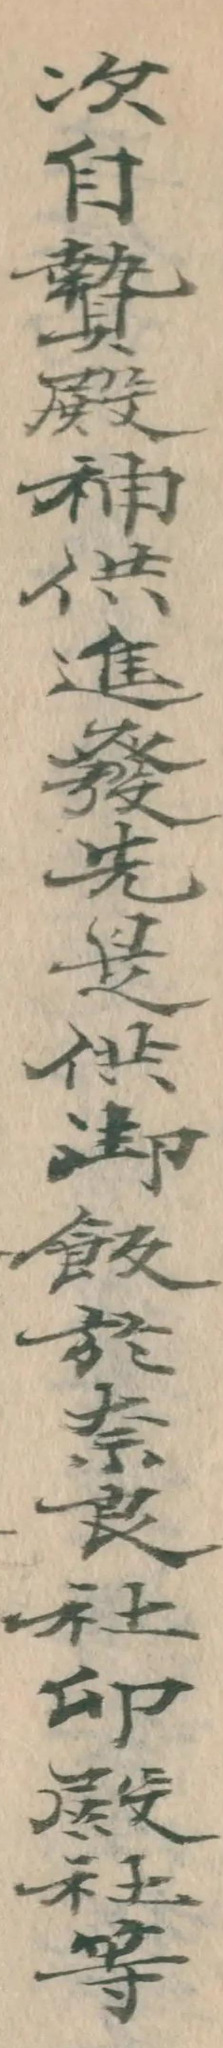次自贄殿神供進発先是供御飯於奈良社卯殿社等
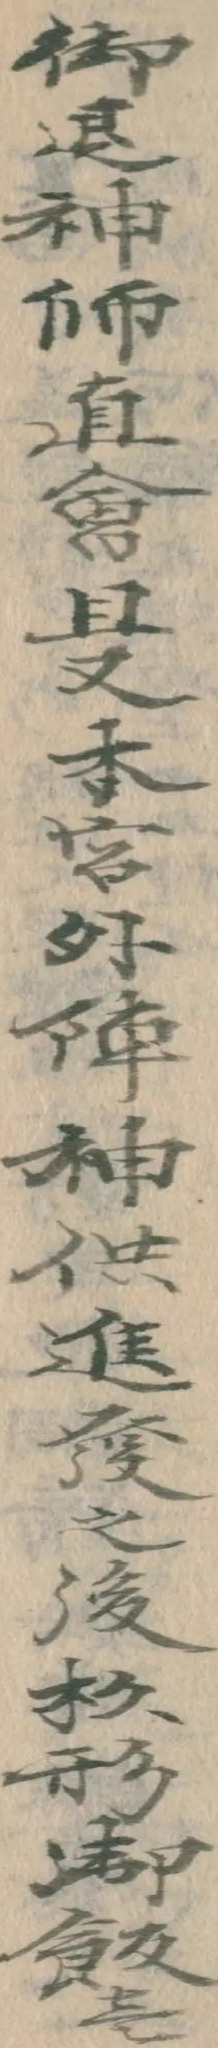御退神師直会且又本宮外陣神供進発之後杉形御飯壱
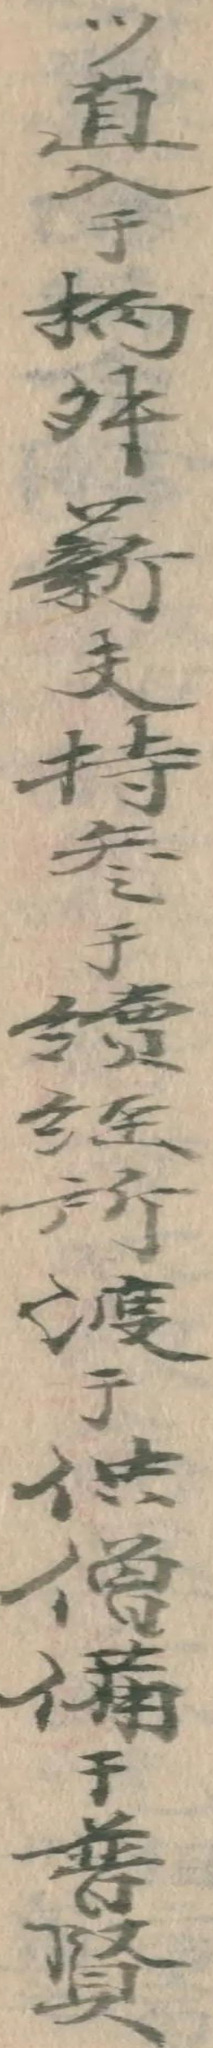ツ直入于柄升薪夫持参于読経所渡于供僧備于普賢
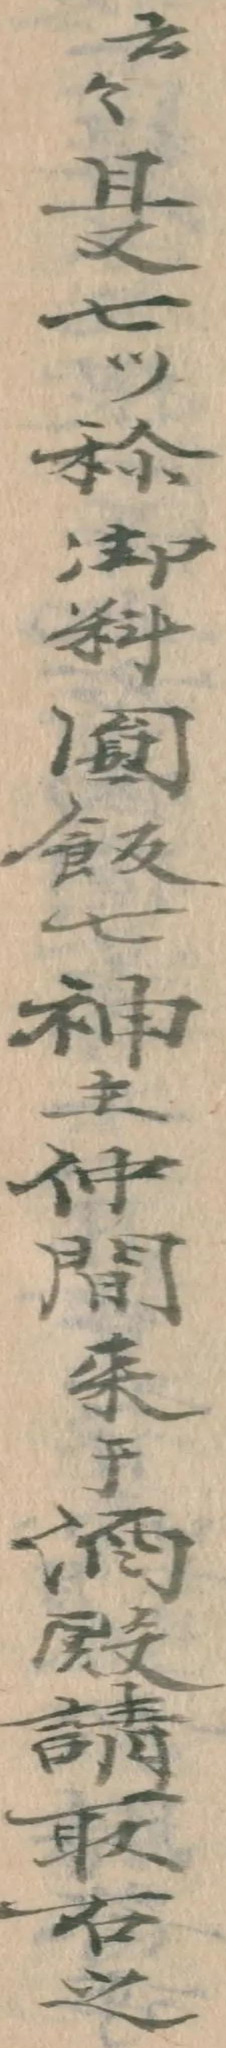云々且又七ツ称御料円飯七神主仲間来于酒殿請取右之

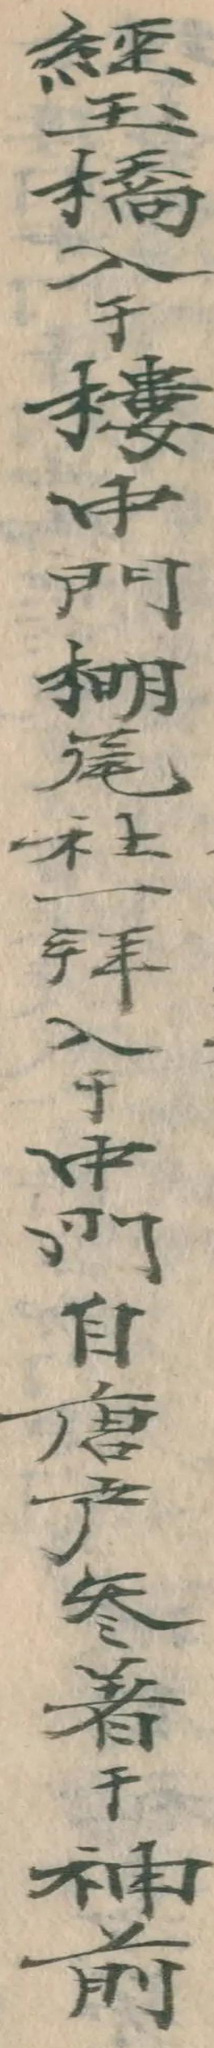經玉橋入于樓中門棚尾社一拝入于中門自唐戸参着于神前
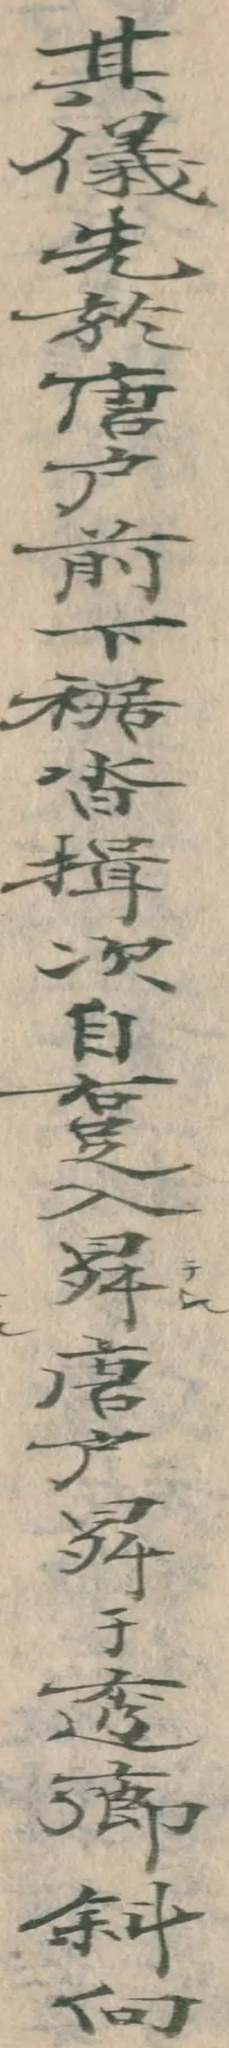其儀先於唐戸前下裾沓揖次自右足入昇唐戸昇于透廊斜向
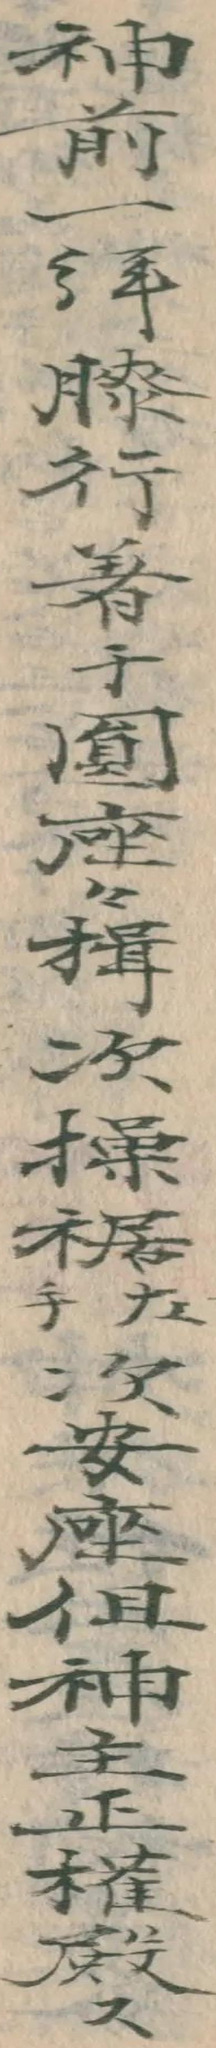神前一拝膝行着于円座々揖次操裾左手次安座但神主正權殿ス
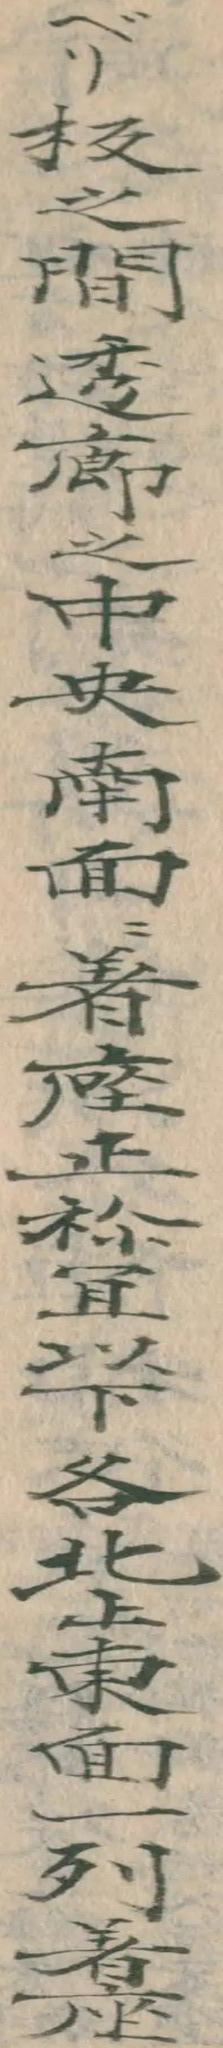ベリ板之間透廊之中央南面ニ着座正祢宜以下各北上東面一列着座
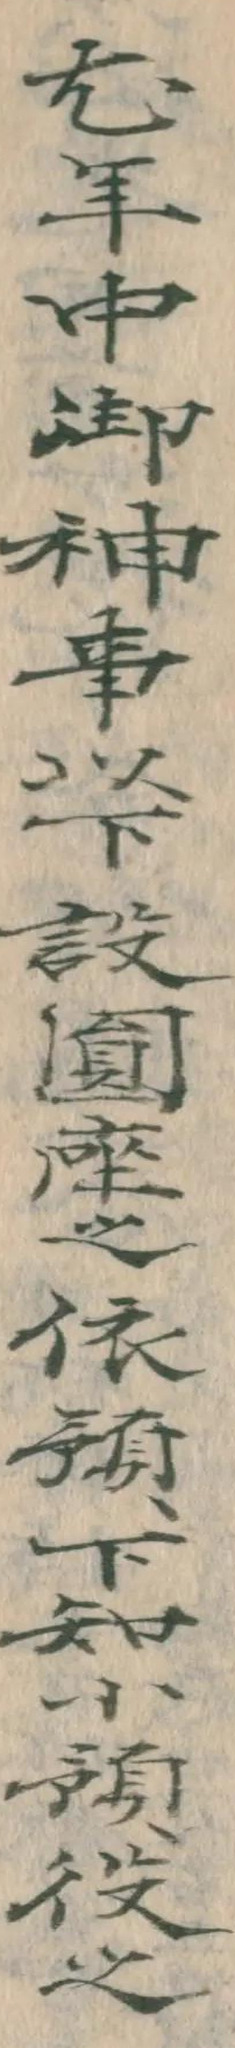尤年中御神事以下設円座之依預下知小預役之
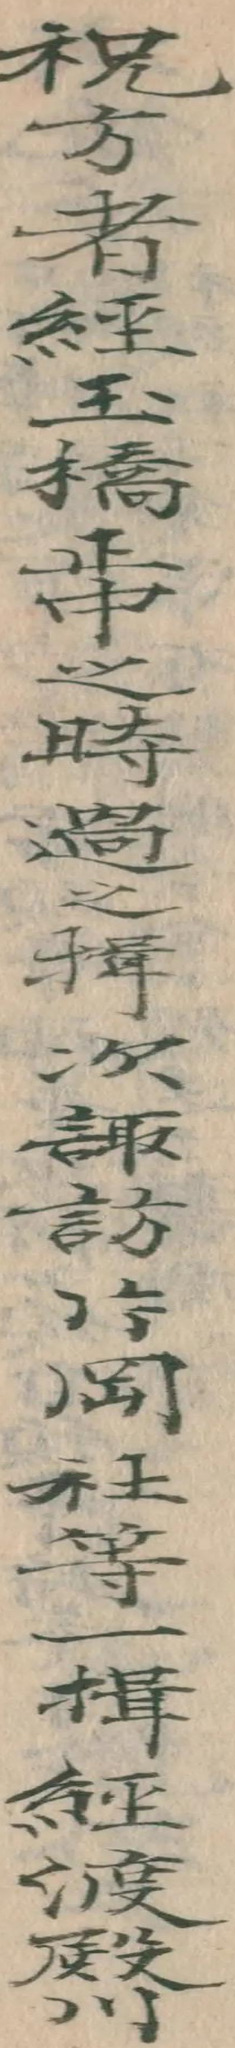祝方者經玉橋正中之時過之揖次諏訪片岡社等一揖經渡殿川
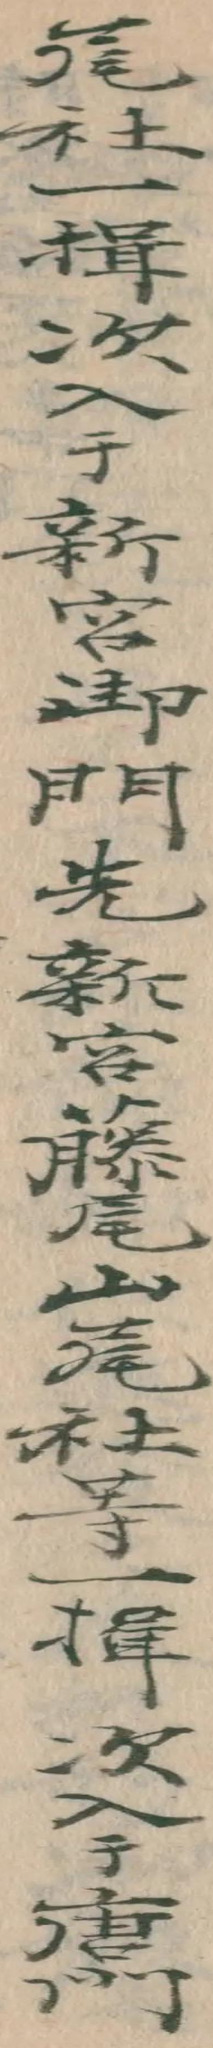尾社一揖次入于新宮御門先新宮藤尾山尾社等一揖次入于唐門
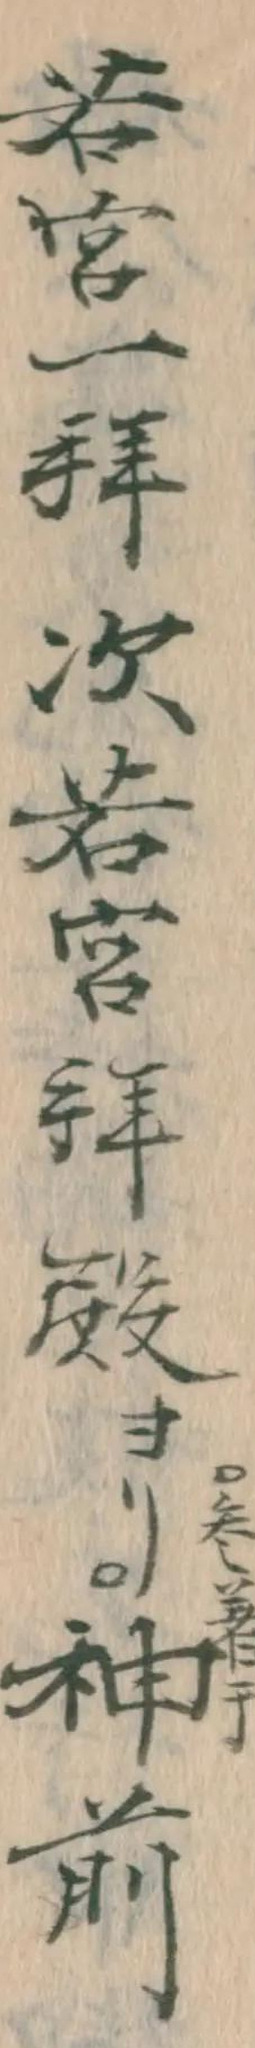若宮一拝次若宮拝殿ヨリ◦神前
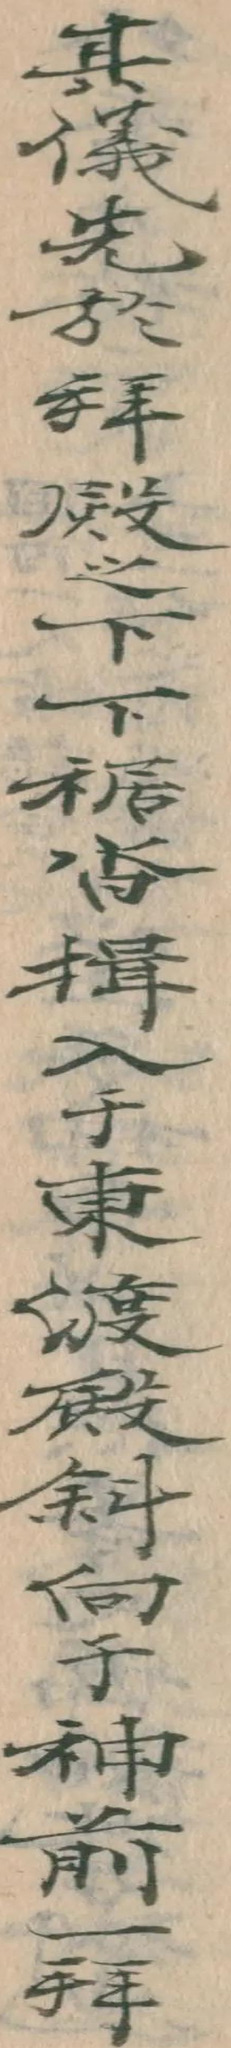其儀先於拝殿之下下裾沓揖入于東渡殿斜向于神前一拝
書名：賀茂社記録. 第9冊
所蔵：国立国会図書館 National Diet Library, JAPAN
